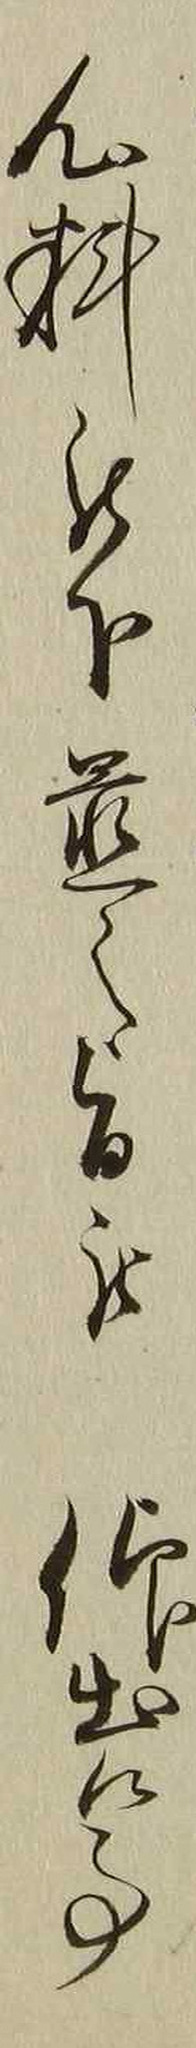心料被下置之旨被仰出候事
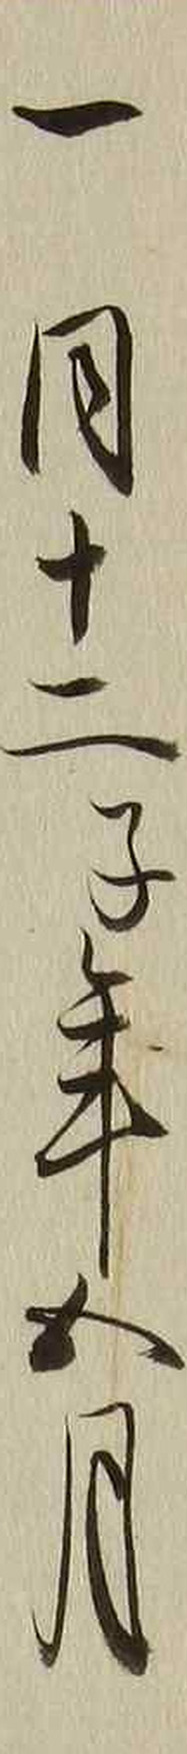一同十二子年五月
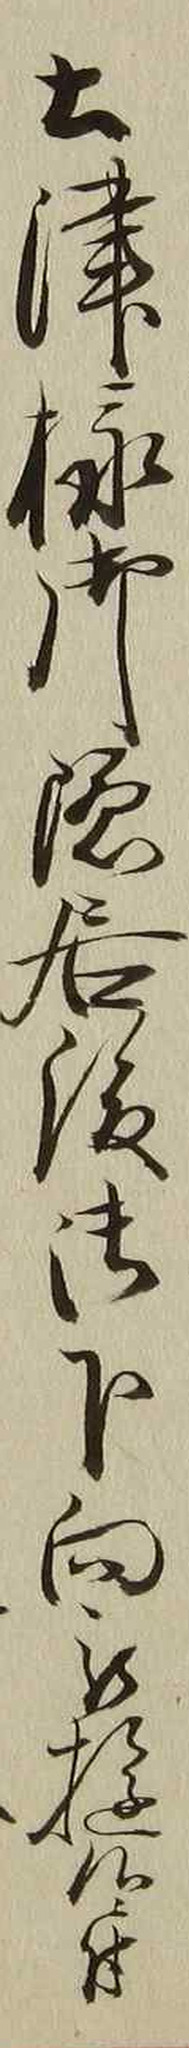土津様御隠居後御下向被遊候に付
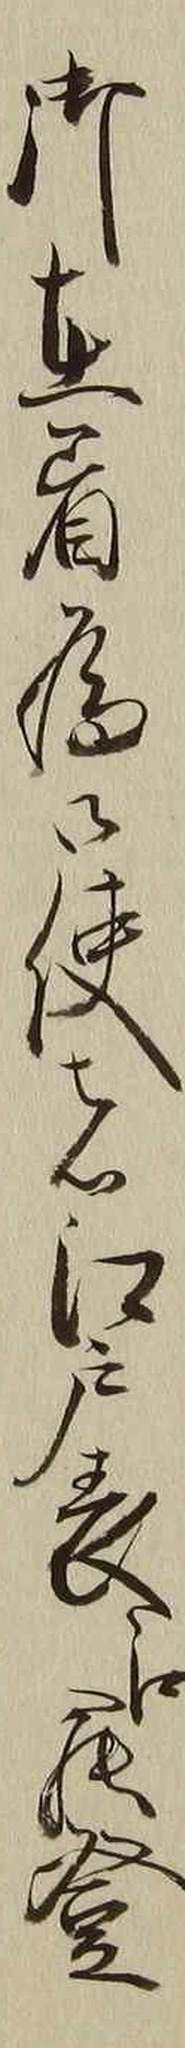御在着為御使者江戸表江罷登
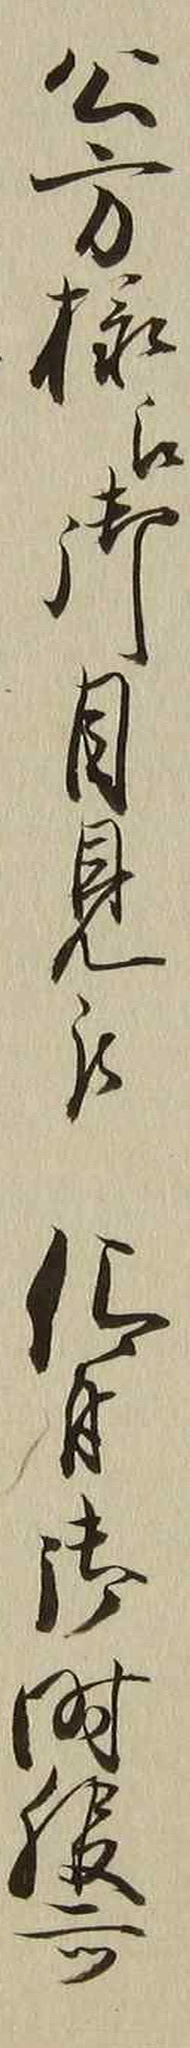公方様江御目見被仰付御時服二つ
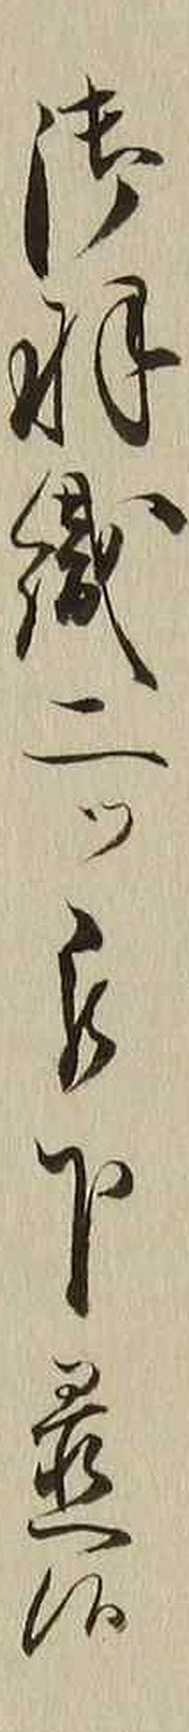御羽織二つ被下置候
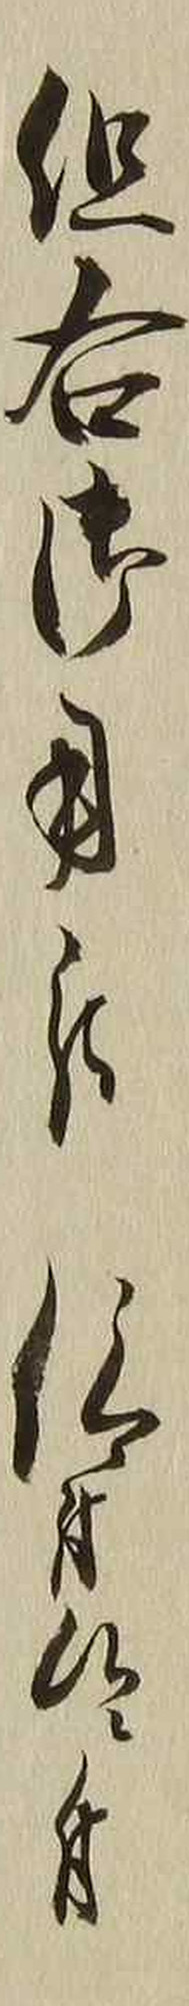但右御用被仰付候に付
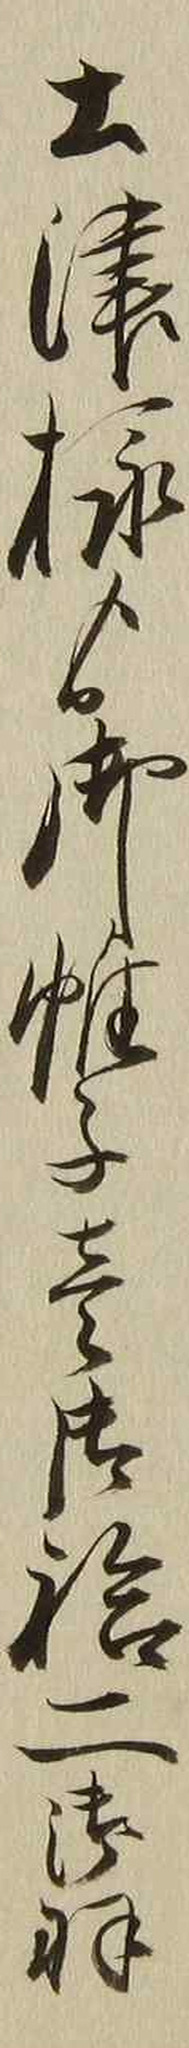土津様ゟ御帷子壱御袷二御羽
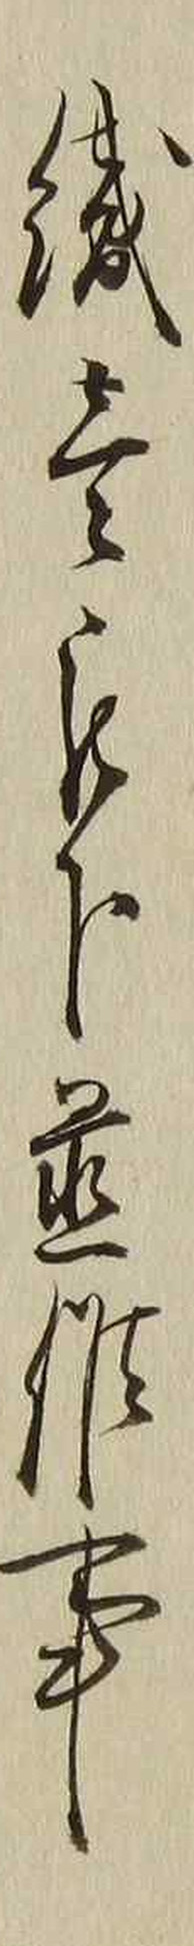織壱被下置候事
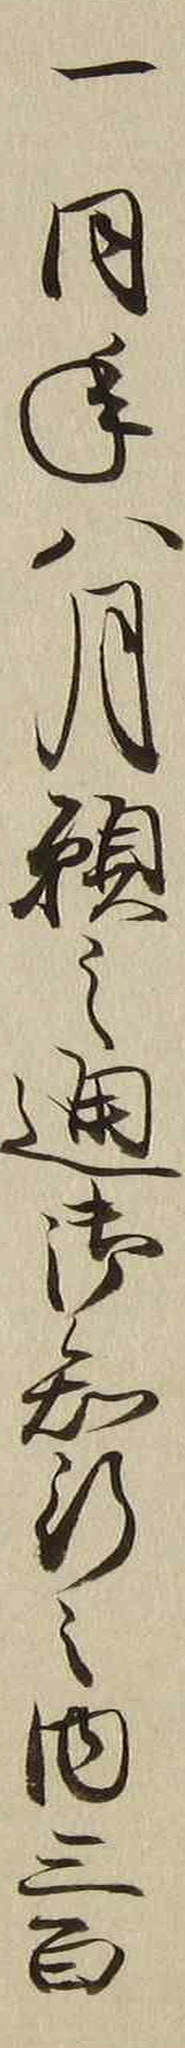一月年八月願之通御知行之内三百
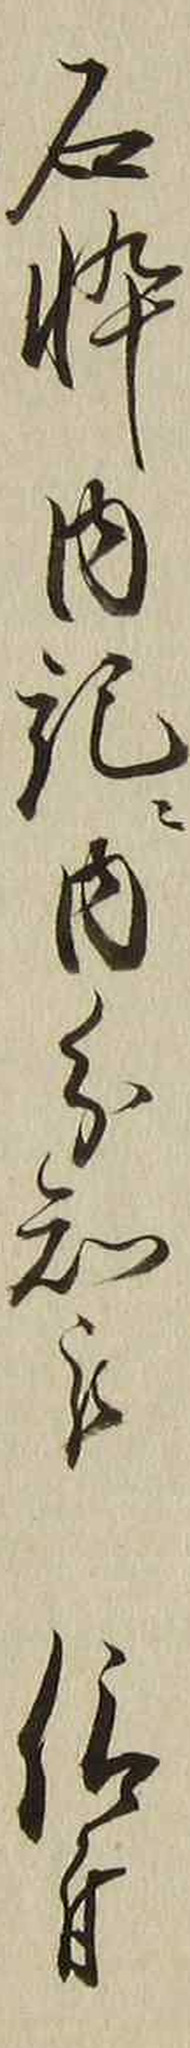石忰内記に内分知被仰付
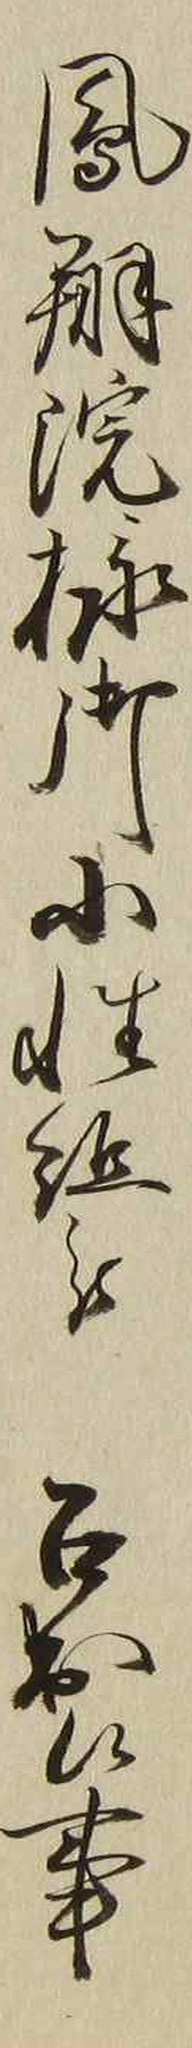鳳翔院様御小性組被召出候事
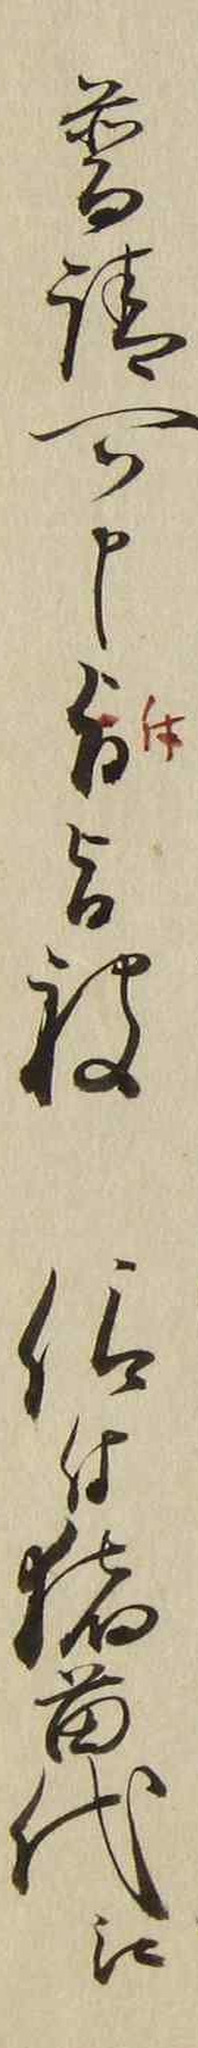普請可申付旨被仰付猪苗代江

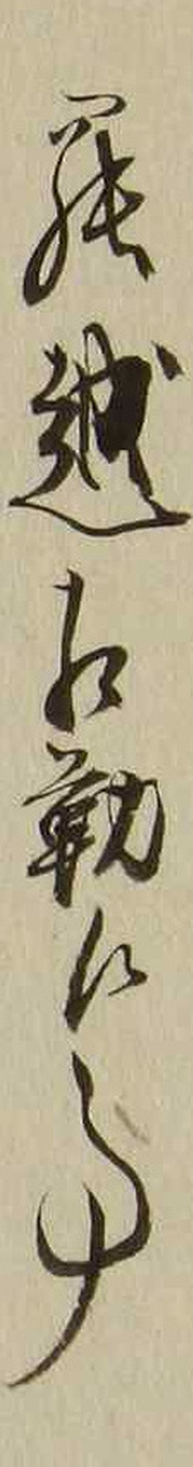罷越相勤候事
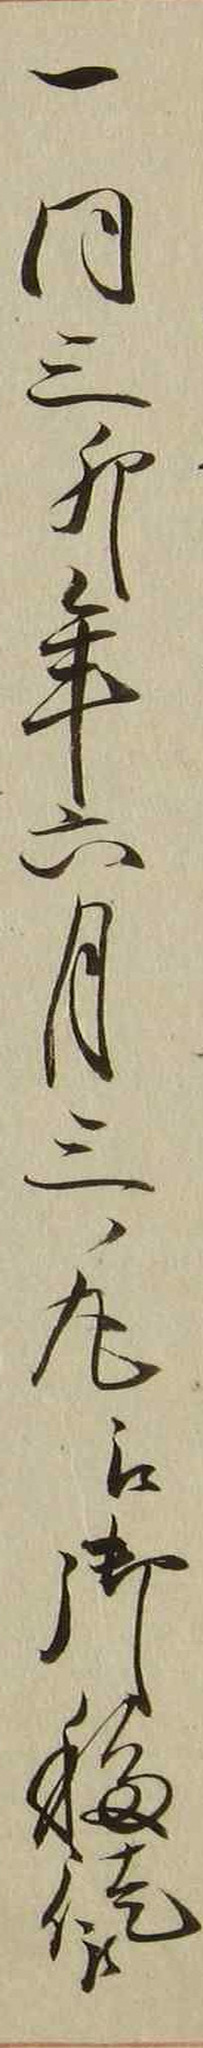一同三卯年六月三丸ノ江御移徒被
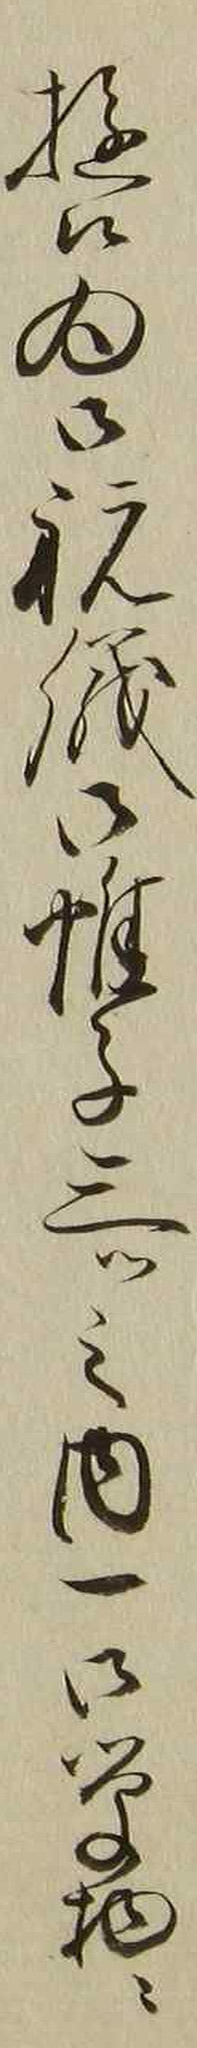遊候為御祝儀御帷子三つ之内一御単物に
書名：諸士系譜　巻之77　を之部11
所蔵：会津若松市立会津図書館
